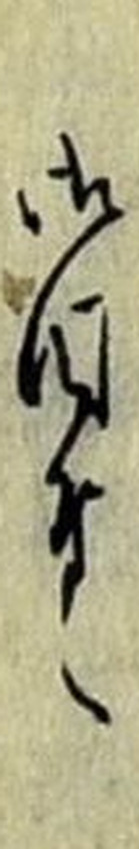御目付へ
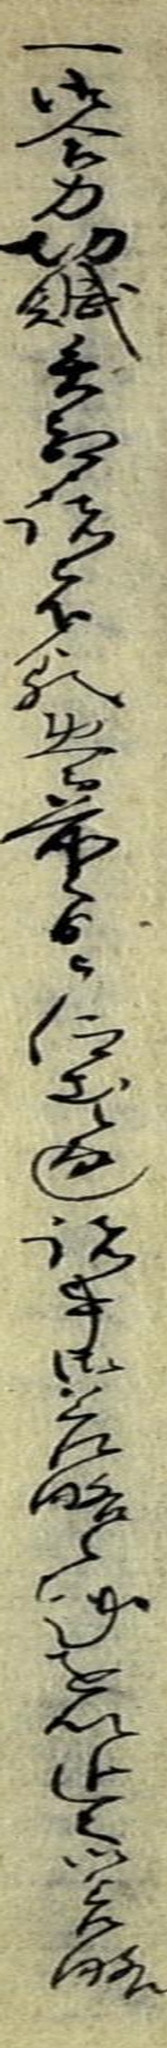一御合力切賦失却諸被下歟決而前々ゟ被仰出候通諸事御差略之趣を以追々御差略
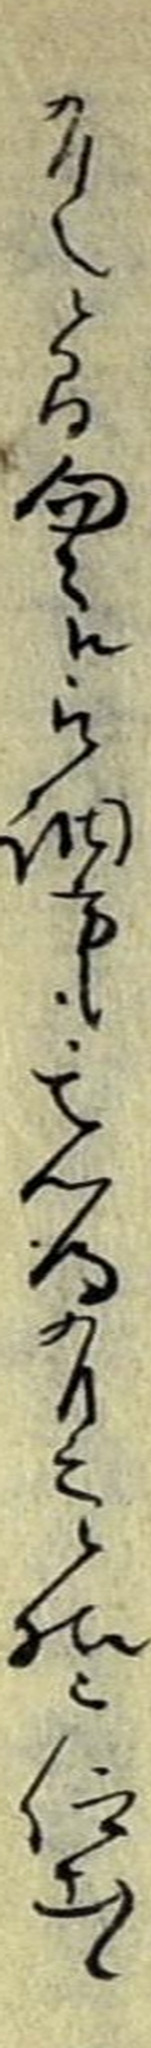有之候間向々江取調方も其心得有之候様被仰出候
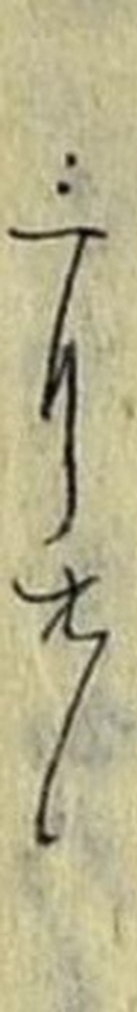三月廿日

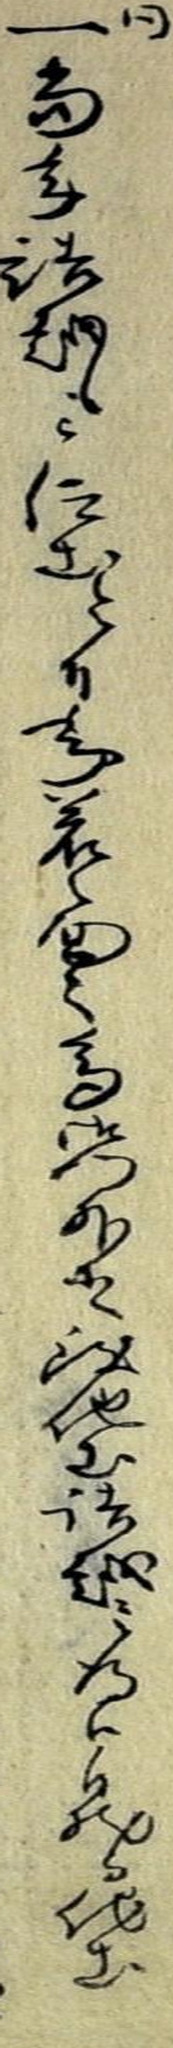一当年詰越も被仰出候ニ付年若之面々御門外等へ致他出詰越ニ候得ハ自然与他出
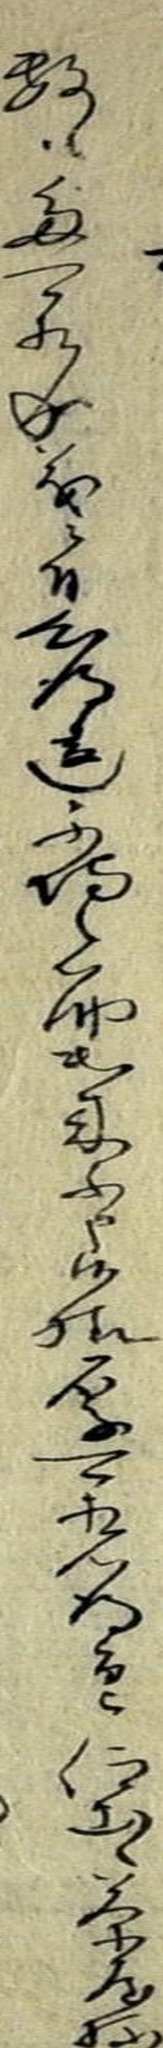数も多可相成義ニ付心得違不埒之筋出来不申候様厚可相心得旨被仰出候茶屋抔へ
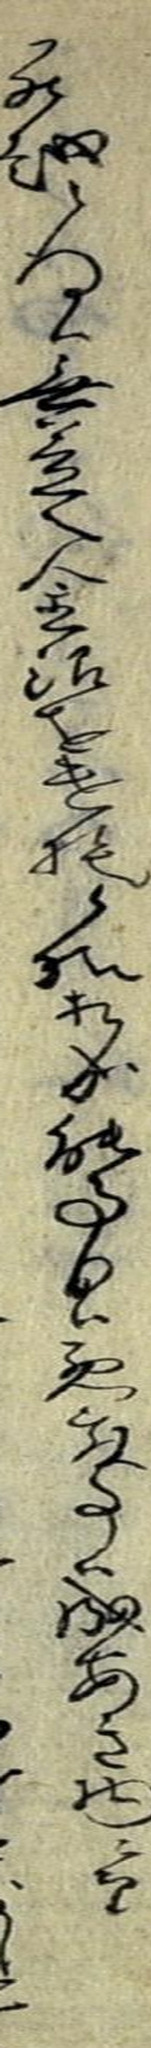罷越候得ハ無益之金銀を遣捨候様相成能事ゟハ悪敷事ハ成安き物ニ而候
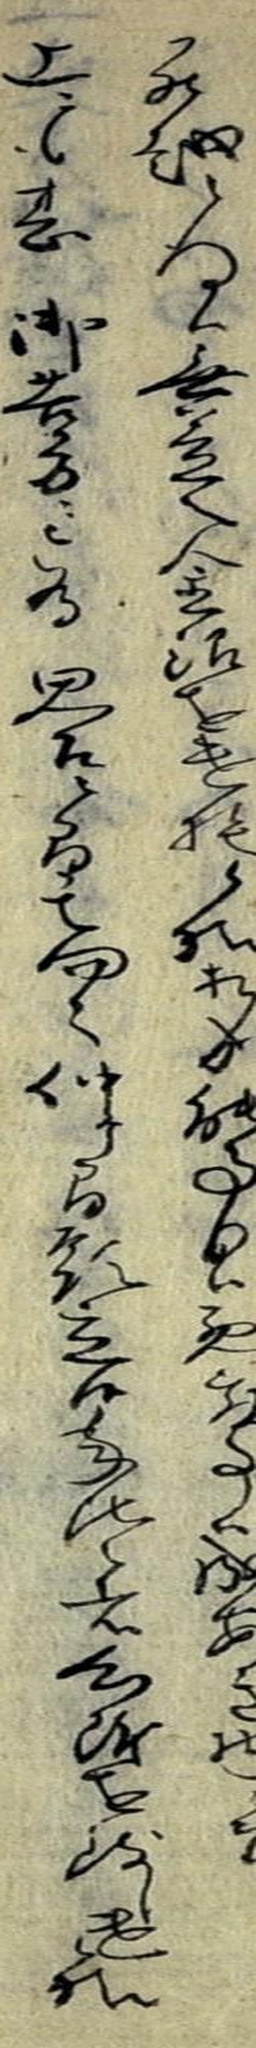上ニも甚御苦労ニ被為思召候間其向々仲ケ間頭立候年頃之者心付を致し遣候様
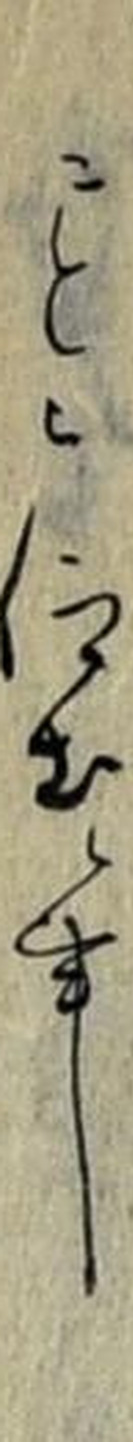ニと被仰出候事
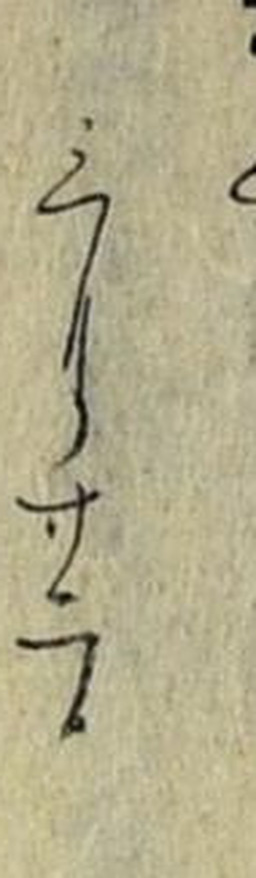三月廿二日
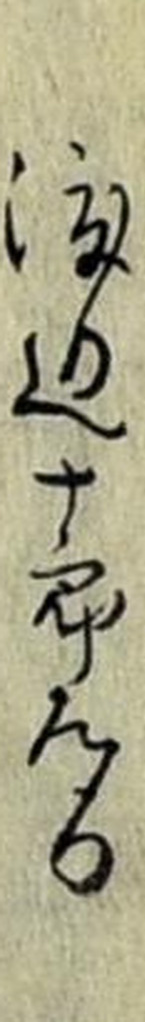同渡辺十郎左衛門
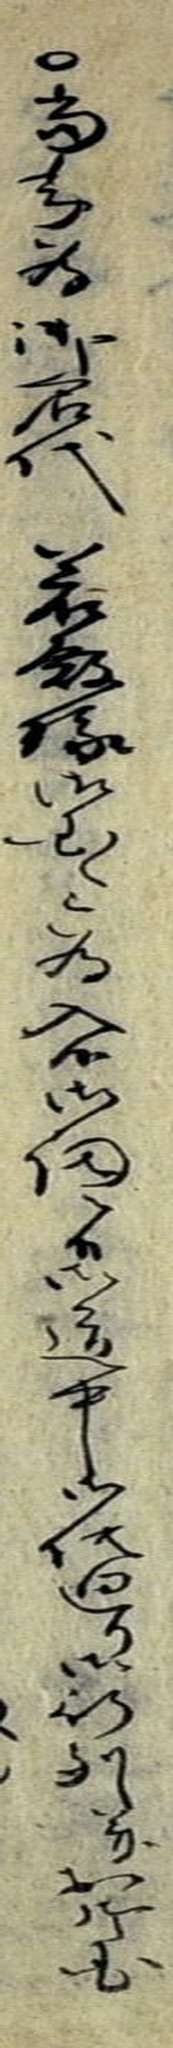〇当年為御名代若殿様御国へ被為入候御伺ニ付御道中御供廻り御行列并於御国
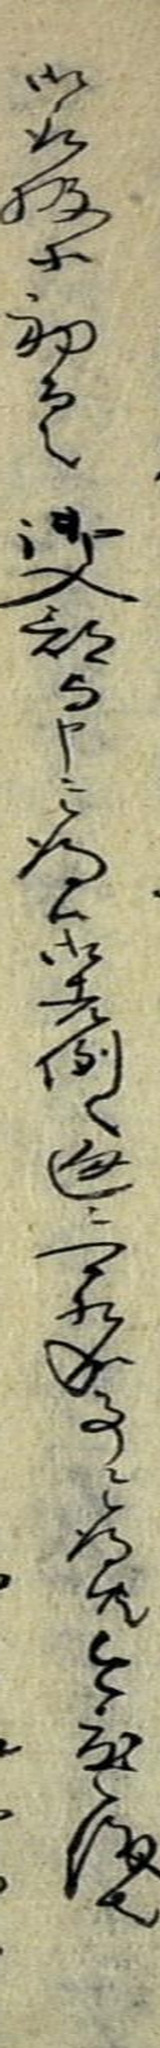御取扱等初而之御入部与申ニ候得ハ御先例之通ニ可相成事ニ候得共今度之儀者
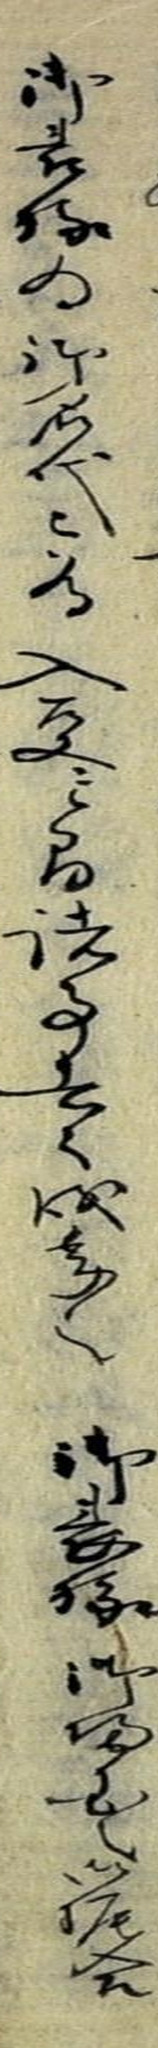御表様為御名代被為入事ニ候間諸事去々戌年之御表様御帰国之御振合
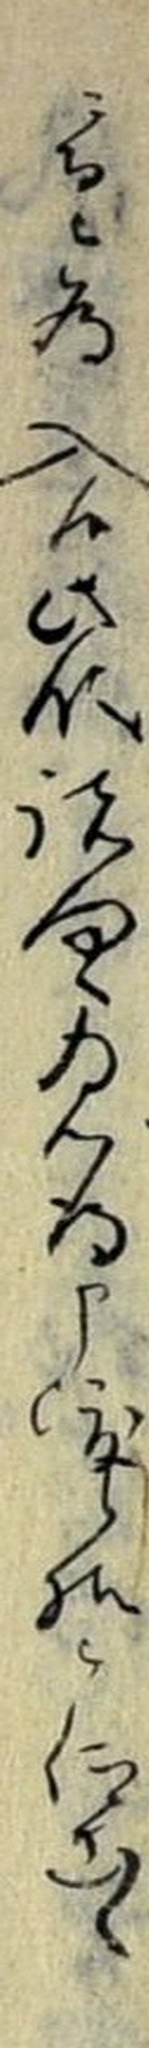ニ而被為入候此段諸向へ為心得申渡候様被仰出候
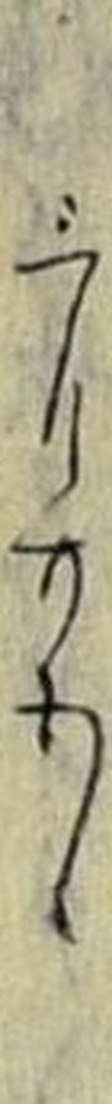三月廿五日
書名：命令之部 三
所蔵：福井県文書館 Fukui Prefectural Archives
